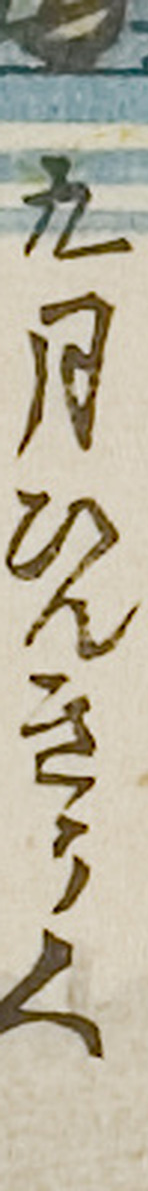九月ひんきう人
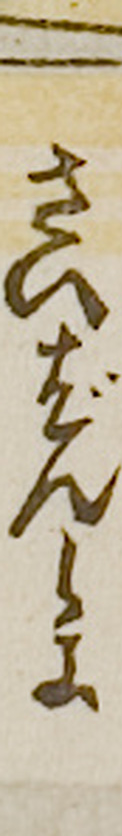さいばんしよ
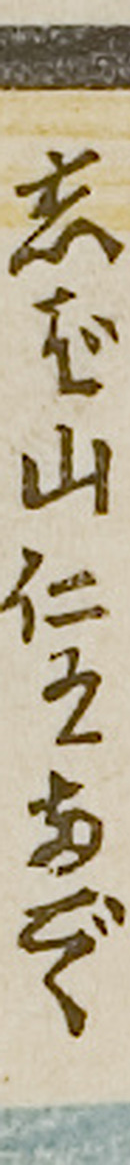しば山仁王両ごく
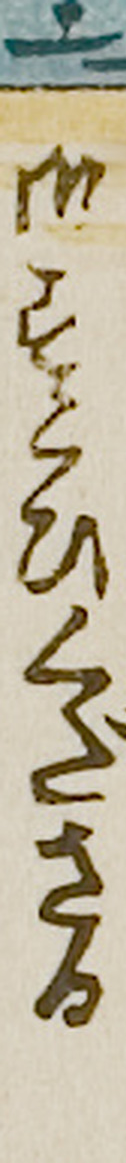御すくひくださる
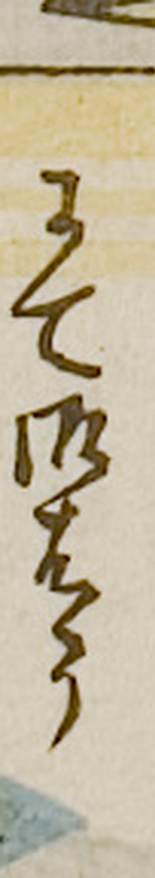にて御はう
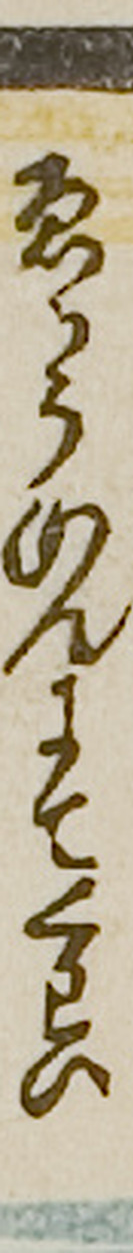ゑかういんにてくわい
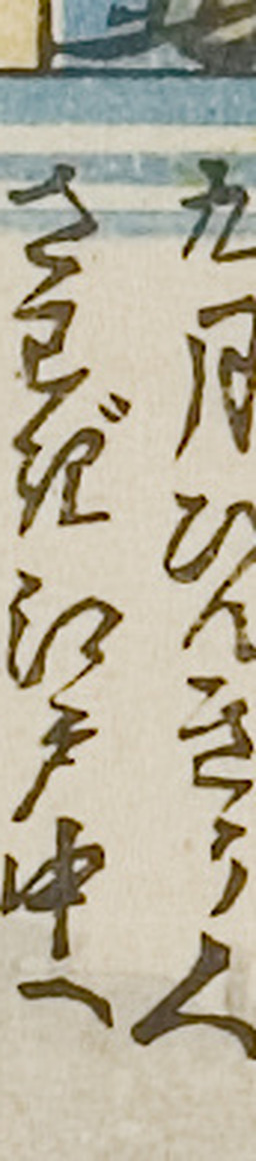さわぎ江戸中へ
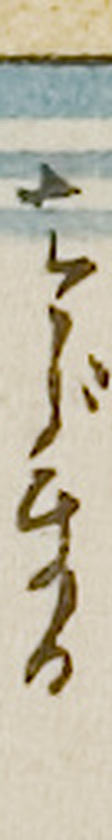はじまる
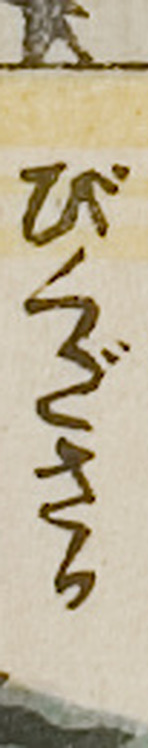びくださる
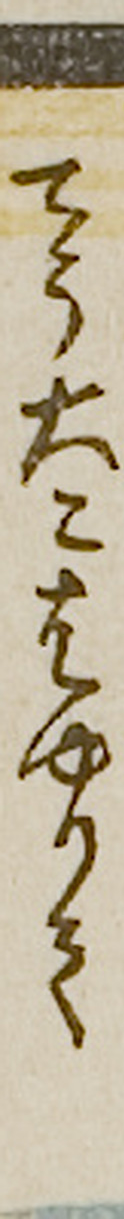てう大にはやりて
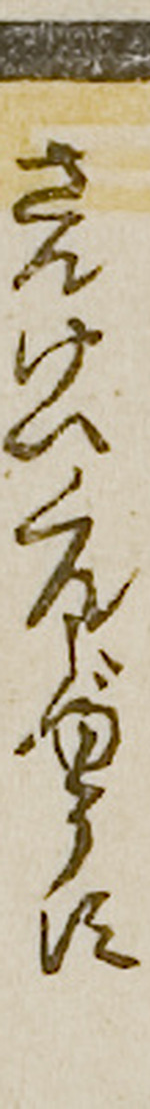さんけいくんじゆうす
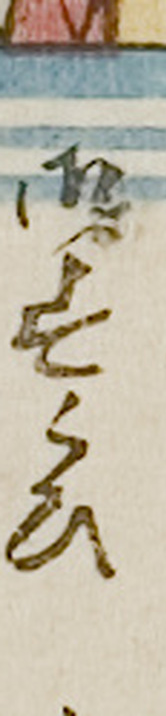御すくひ
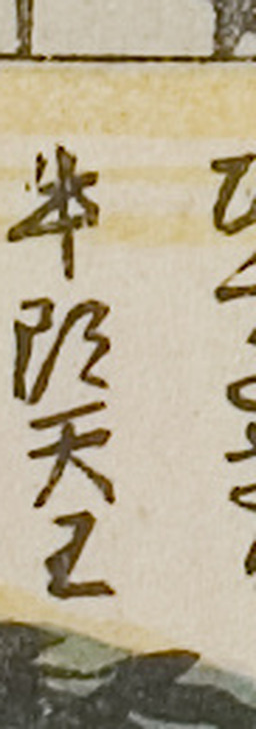牛頭天王
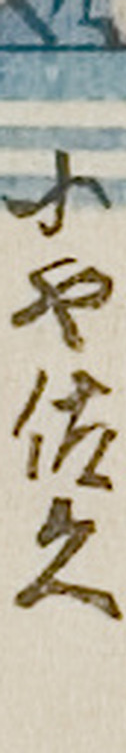小や佐久
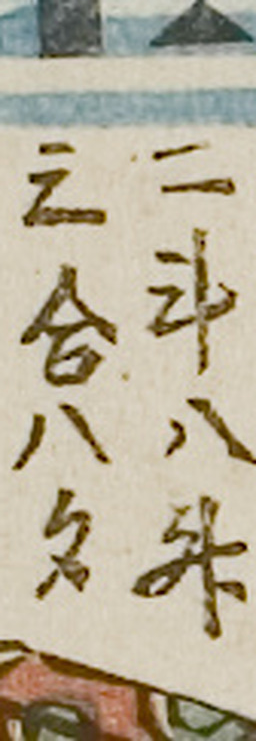三合八勺
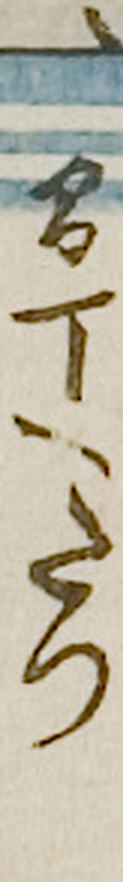間丁へたつ
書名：嘉永年間より米相場直段并年代記書抜大新版
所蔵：東京大学総合図書館 General Library in the University of Tokyo, JAPAN
